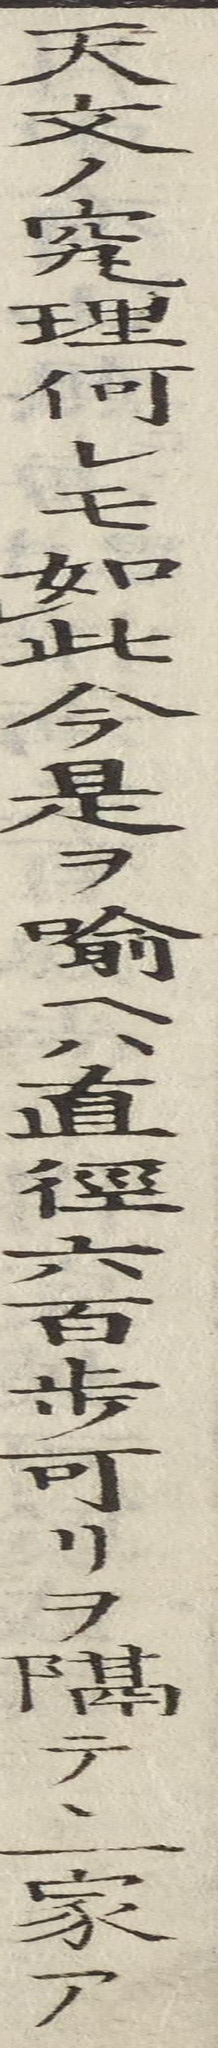天文ノ究理何レモ如此今是ヲ喩ヘハ直径六百歩可リヲ隔テヽ一家ア
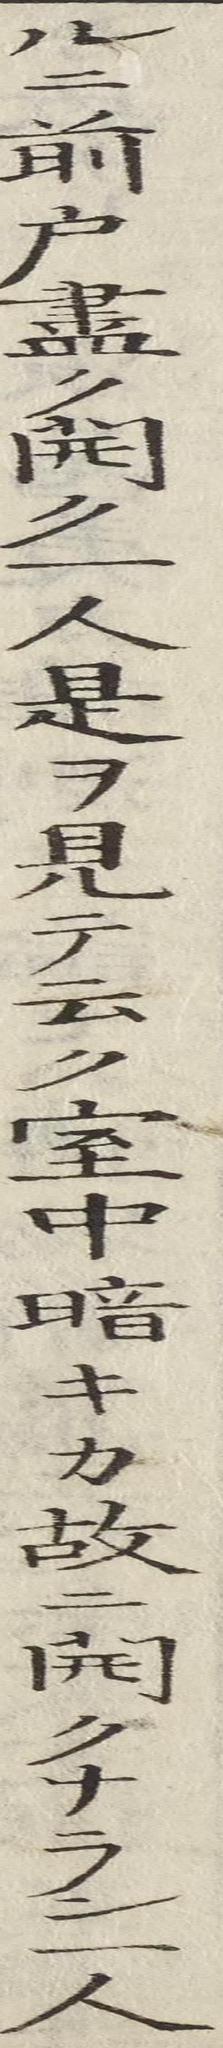ルニ前戸盡ク開ク一人是ヲ見テ云ク室中暗キカ故ニ開クナラン一人
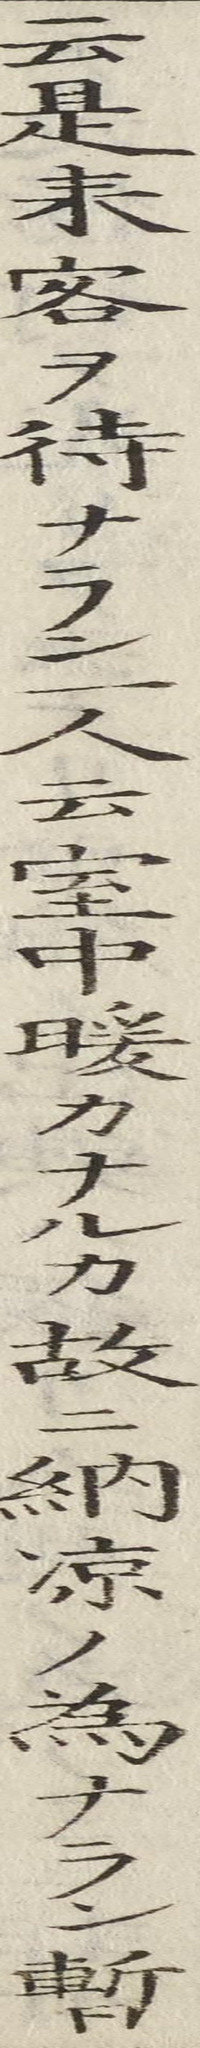云是来客ヲ待ナラン一人云室中暖カナルカ故ニ納涼ノ為ナラン暫
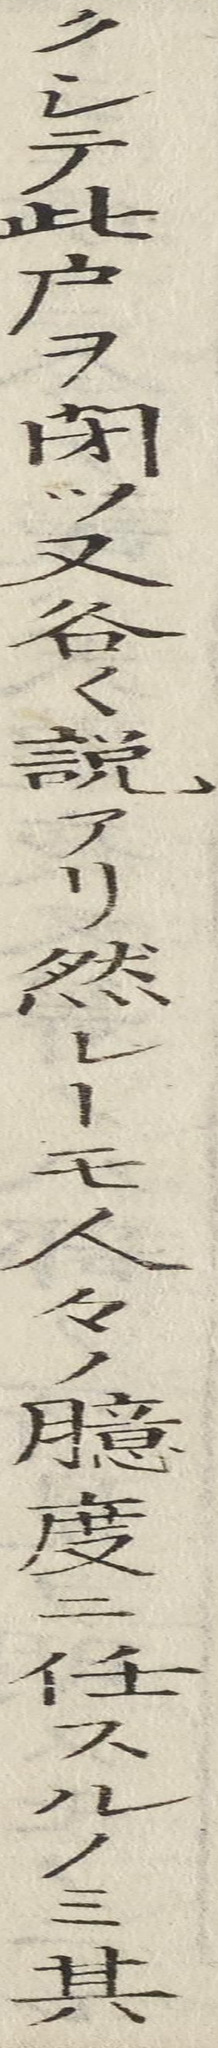クシテ此戸ヲ閉ツ又各〱説アリ然レトモ人々ノ臆度ニ任スルノミ其
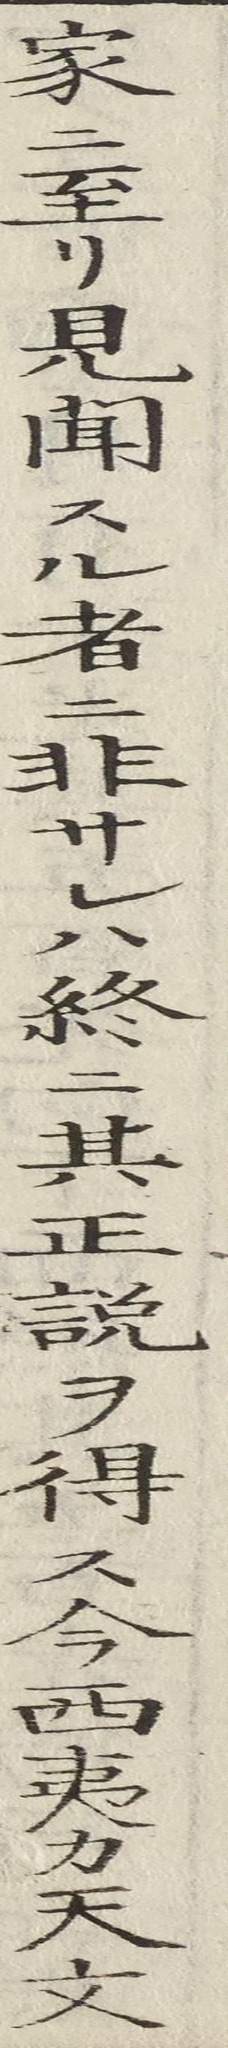家ニ至リ見聞スル者ニ非サレハ終ニ其正説ヲ得ス今西夷カ天文
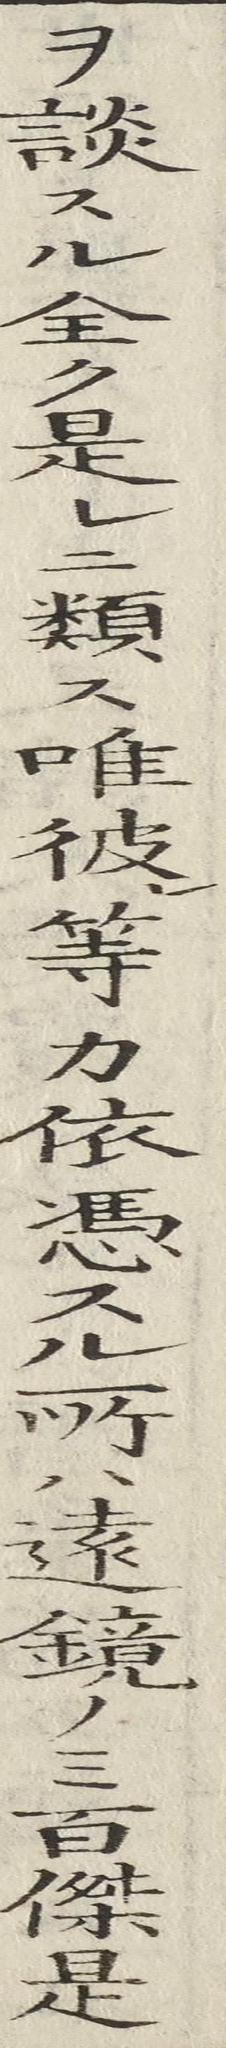ヲ談スル全ク是レニ類ス唯彼等カ依慿スル所ハ遠鏡ノミ百傑是
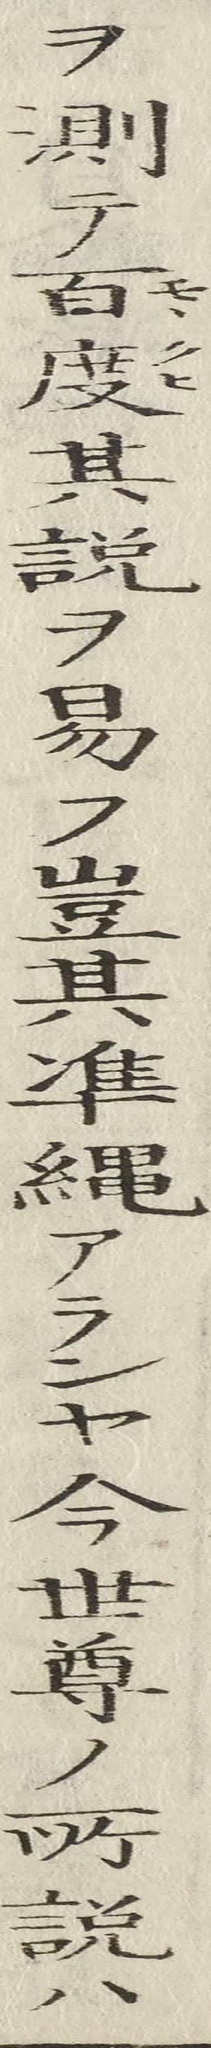ヲ測テ百度其説ヲ易フ豈其準縄アランヤ今世尊ノ所説ハ
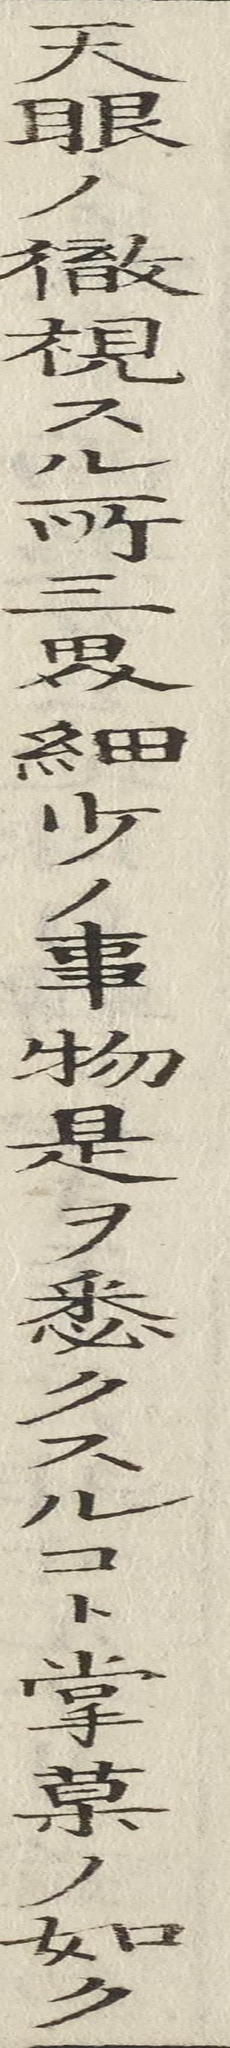天眼ノ徹視スル所三界細少ノ事物是ヲ悉クスルコト掌菓ノ如ク
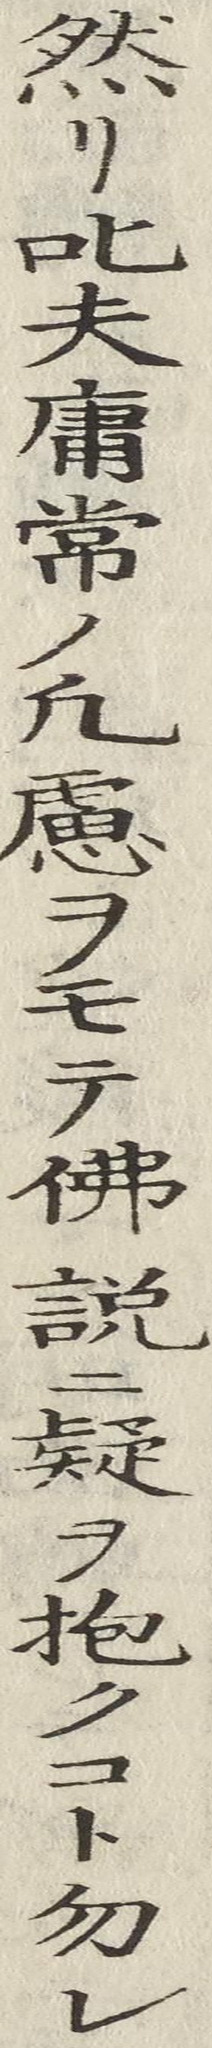然リ叱夫雇常ノ凡慮ヲモテ仏説ニ疑ヲ抱クコト勿レ
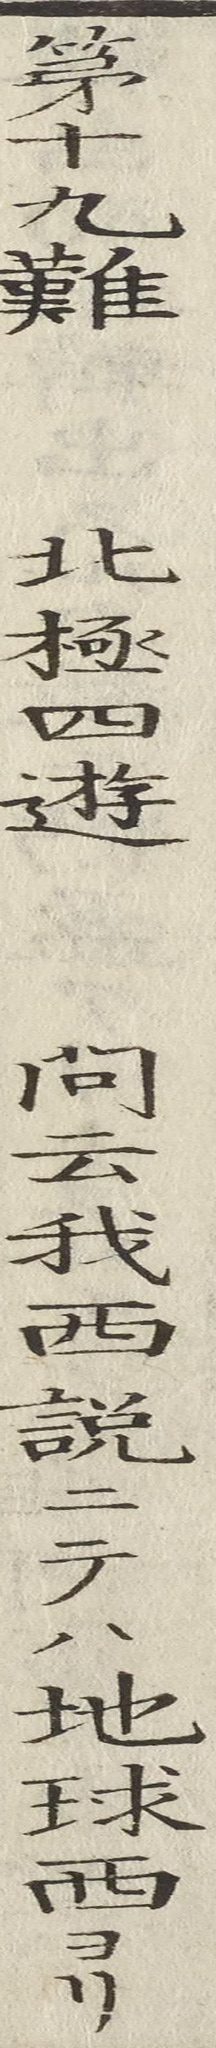第十九難北極四遊問云我西説ニテハ地球西ヨリ
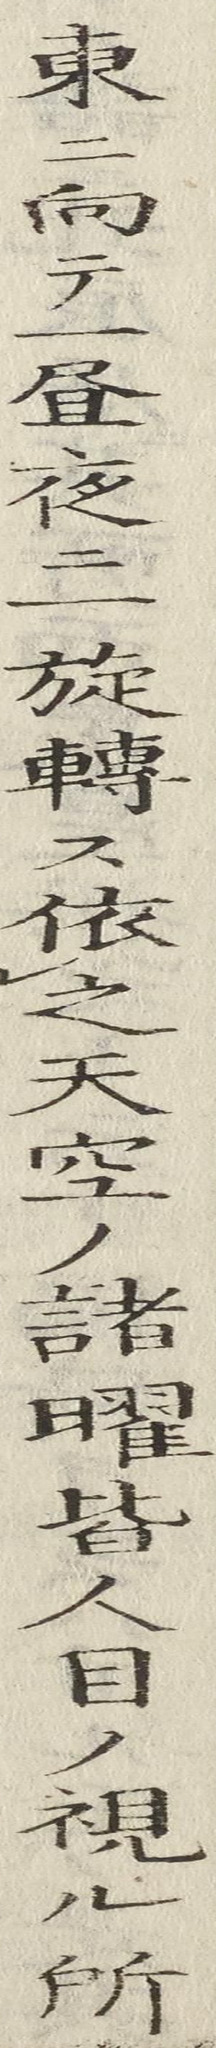東ニ向テ一昼夜ニ一旋転ス依之天空ノ諸曜皆人目ノ視ル所
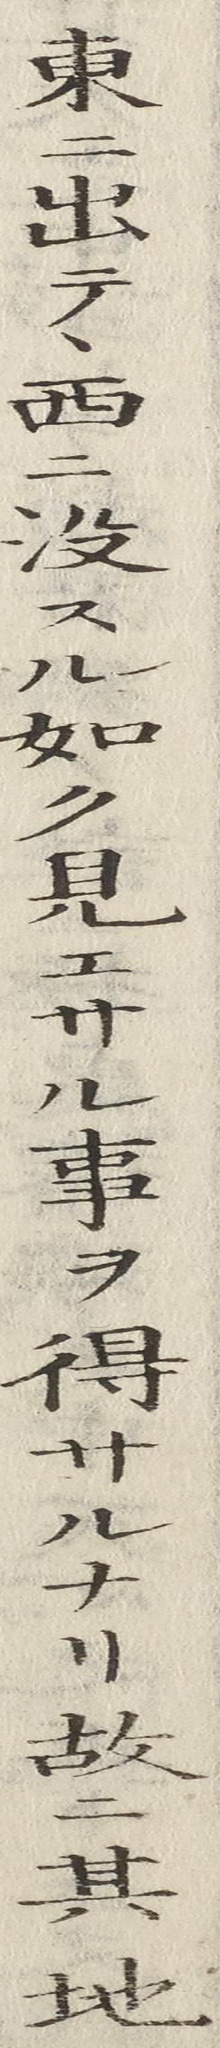東ニ出テヽ西ニ没スル如ク見エサル事ヲ得サルナリ故ニ其地
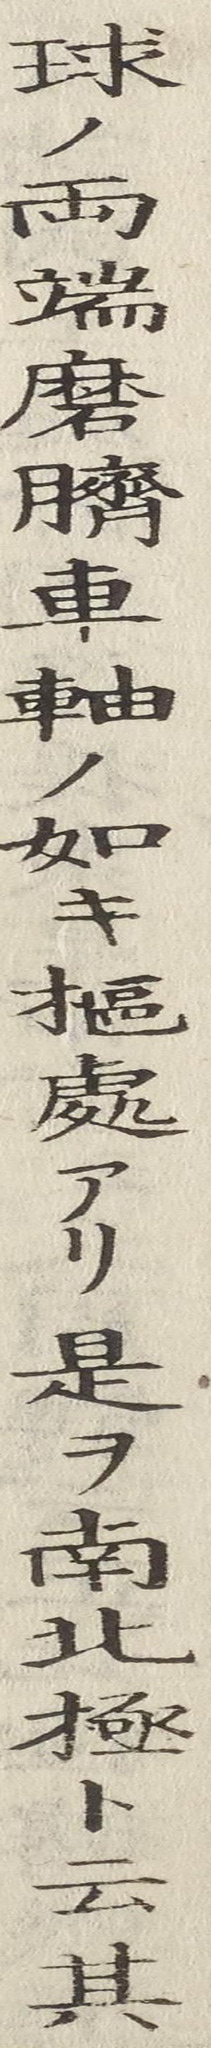球ノ両端磨臍車軸ノ如キ枢処アリ是ヲ南北極ト云其
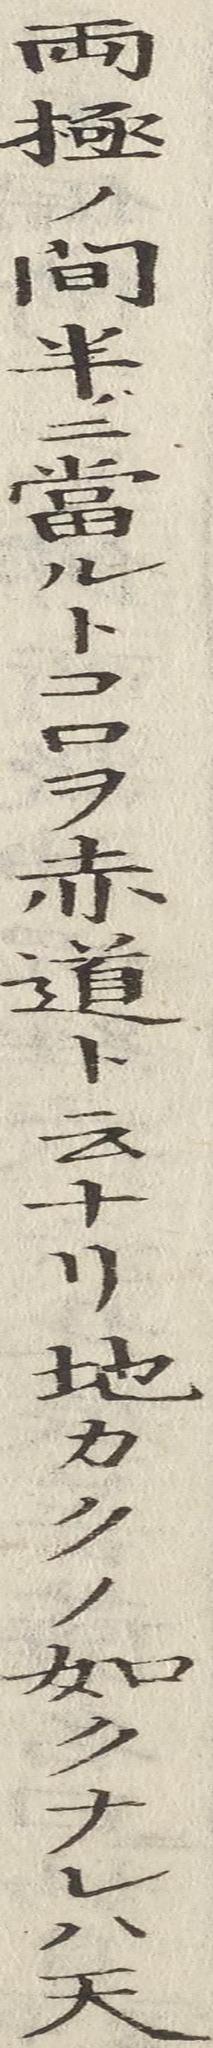両極ノ間半ニ当ルトコロヲ赤道ト云ナリ地カクノ如クナレハ天
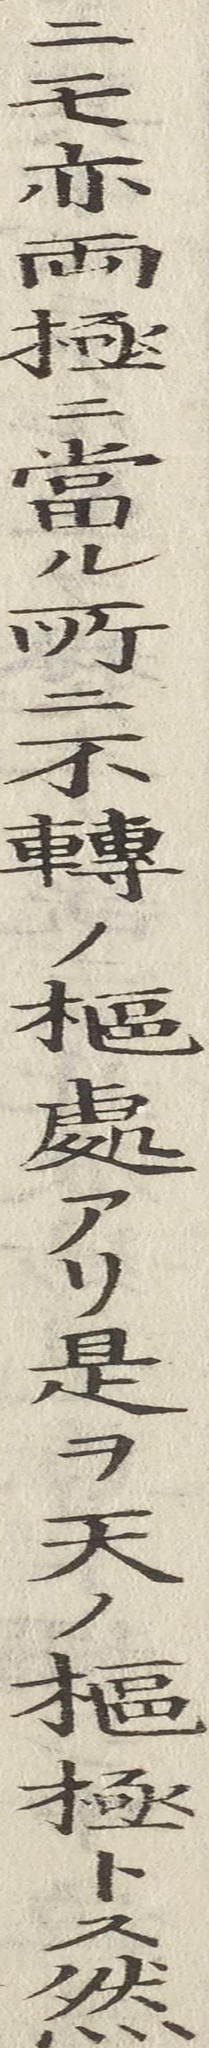ニモ亦両極ニ当ル所ニ不転ノ枢処アリ是ヲ天ノ枢極トス然
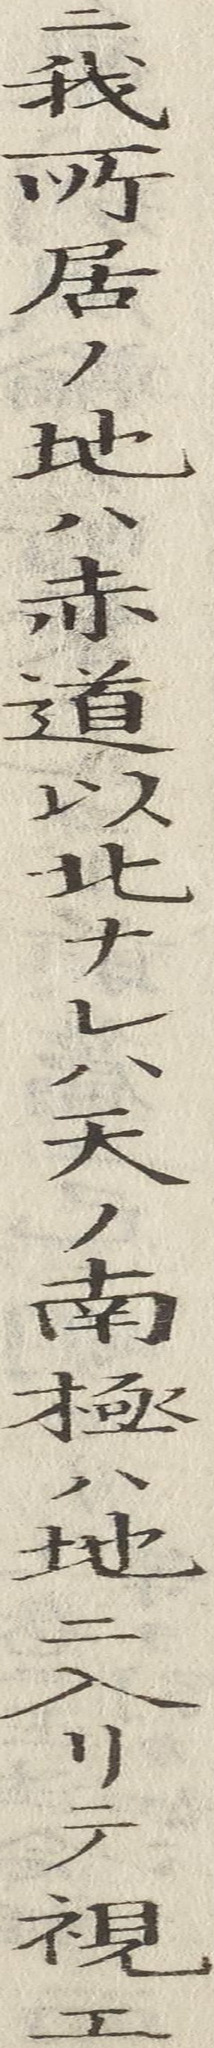ニ我所居ノ地ハ赤道以北ナレハ天ノ南極ハ地ニ入リテ視エ
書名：護法新論　二編　中
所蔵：東京大学地震研究所図書室 Earthquake Research Institute Library, The University of Tokyo, JAPAN
